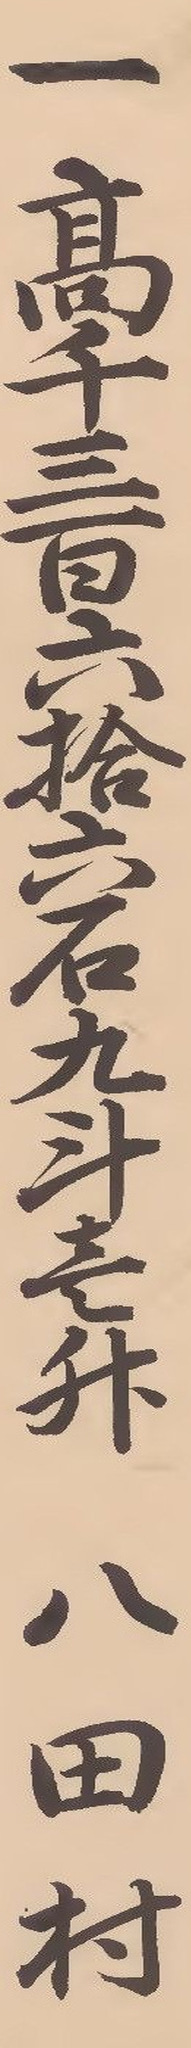一高千三百六拾六石九斗壱升八田村
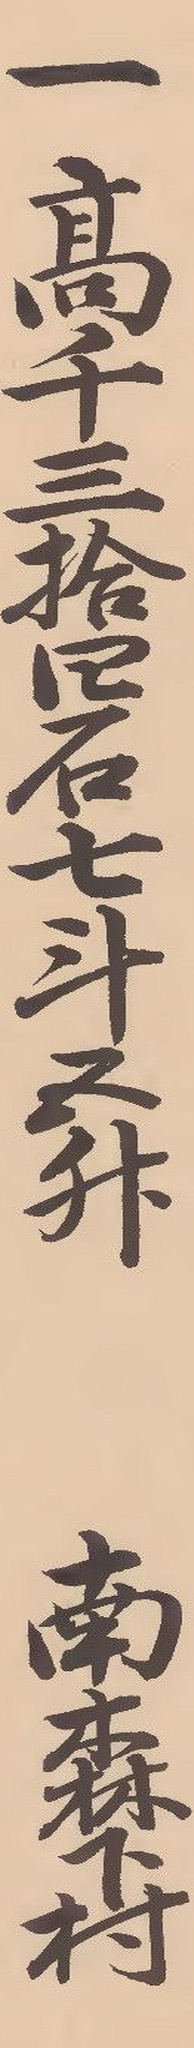一高千三拾四石七斗五升南森下村

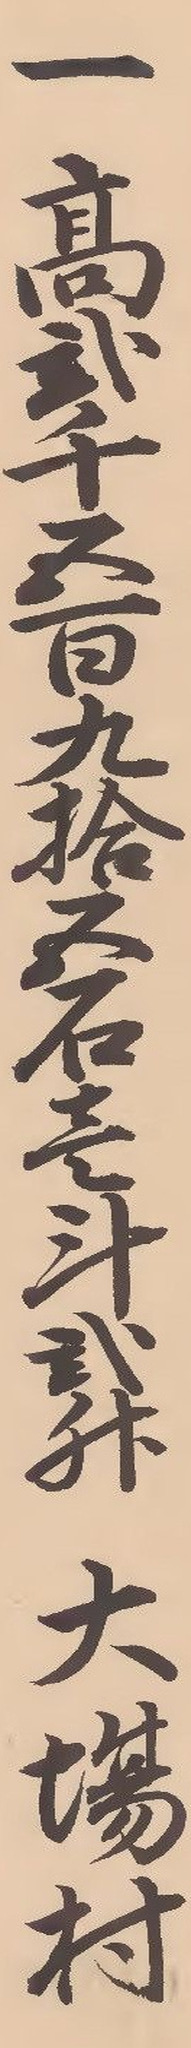一高弐千五百九拾五石壱斗弐升大場村
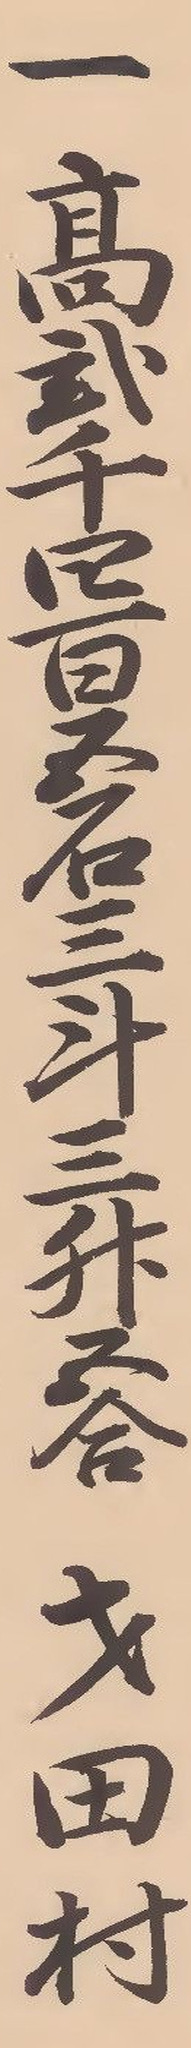一高弐千四百五石三斗三升五合才田村
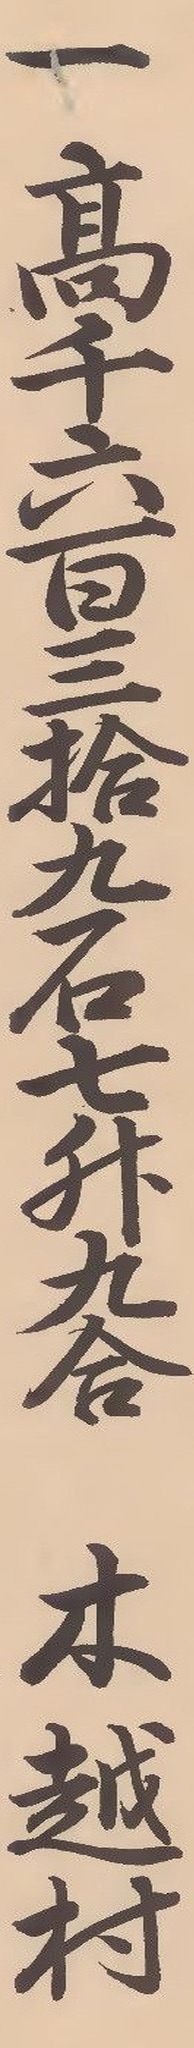一高千六百三拾九石七升九合木越村
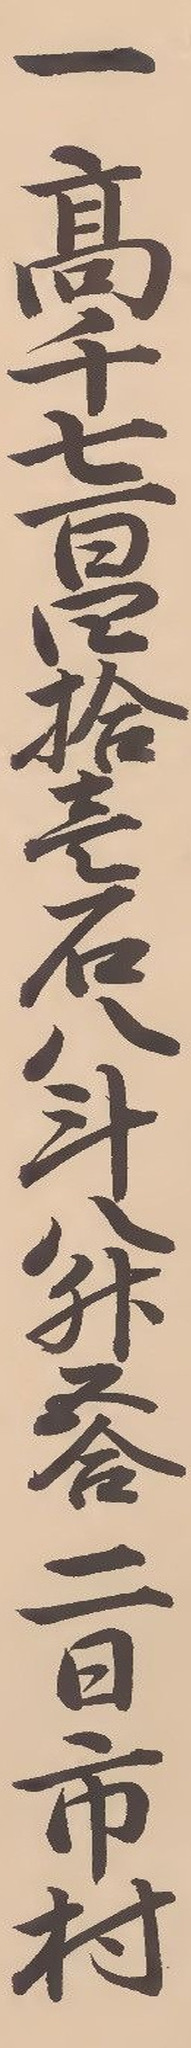一高千七百四拾壱石八斗八升五合二日市村
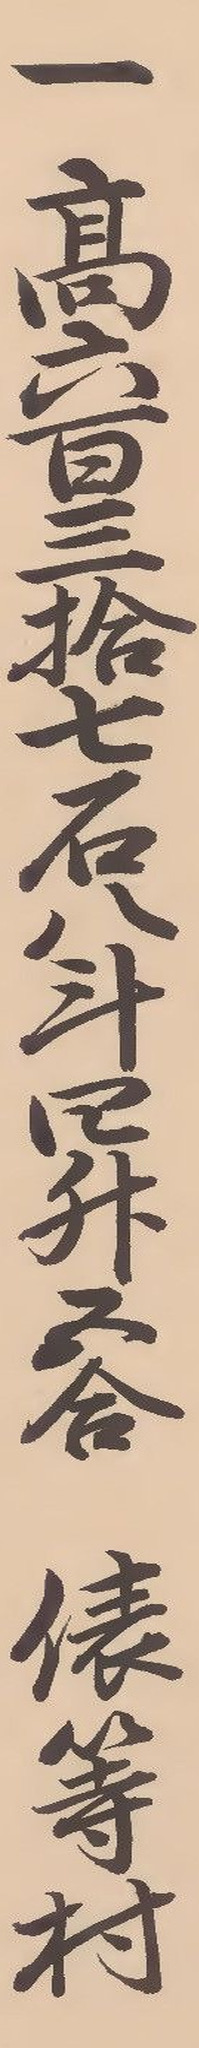一高六百三拾七石八斗四升五合俵等村

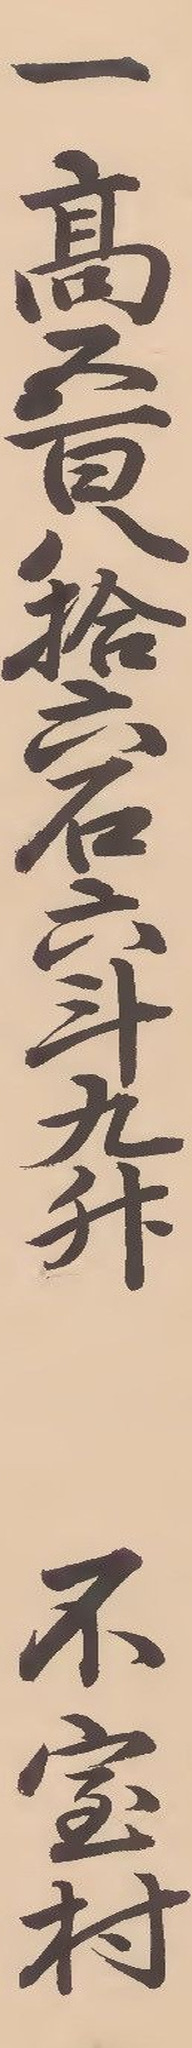一高五百八拾六石六斗九升不室村
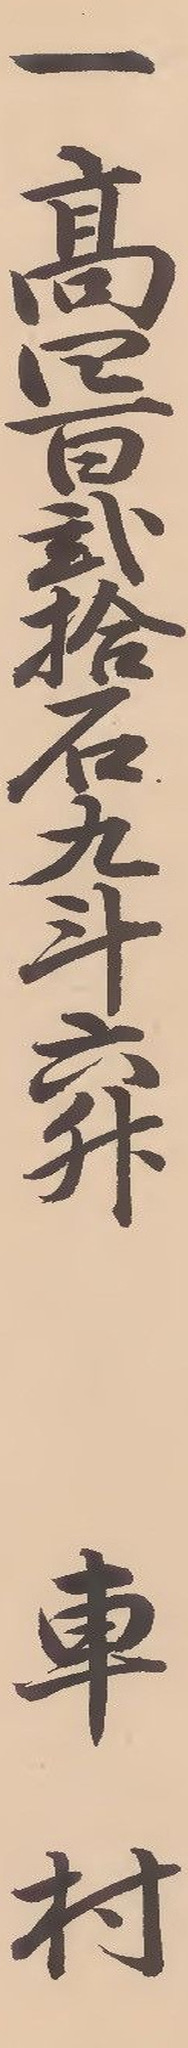一高四百弐拾石九斗六升車村
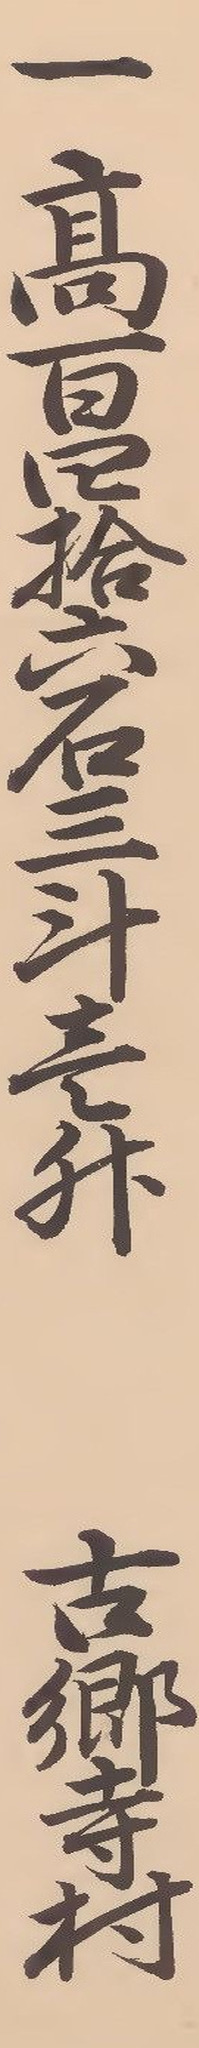一高百四拾六石三斗壱升古郷寺村

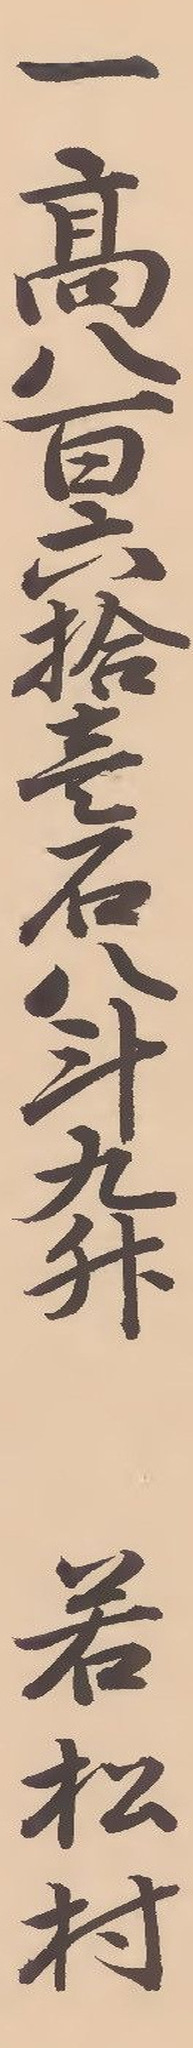一高八百六拾壱石八斗九升若松村
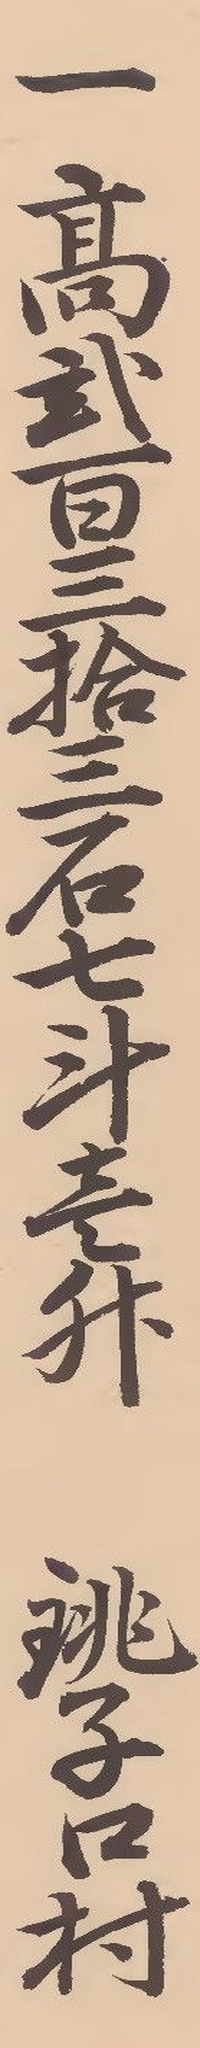一高弐百三拾三石七斗壱升銚子口村
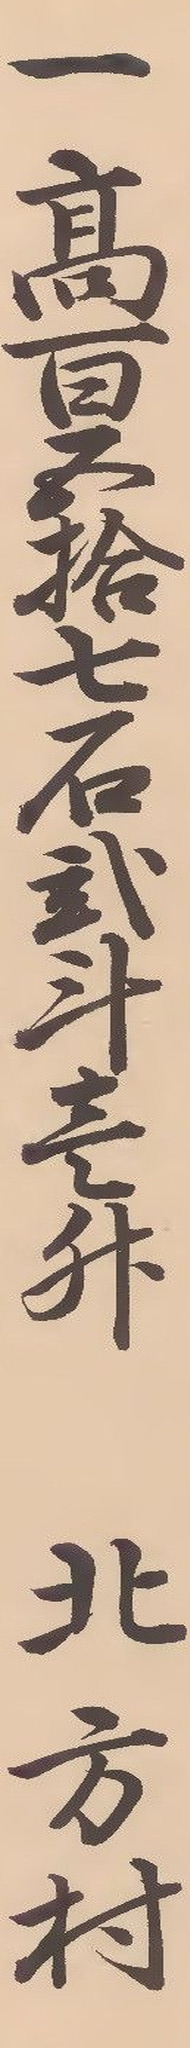一高百五拾七石弐斗壱升北方村
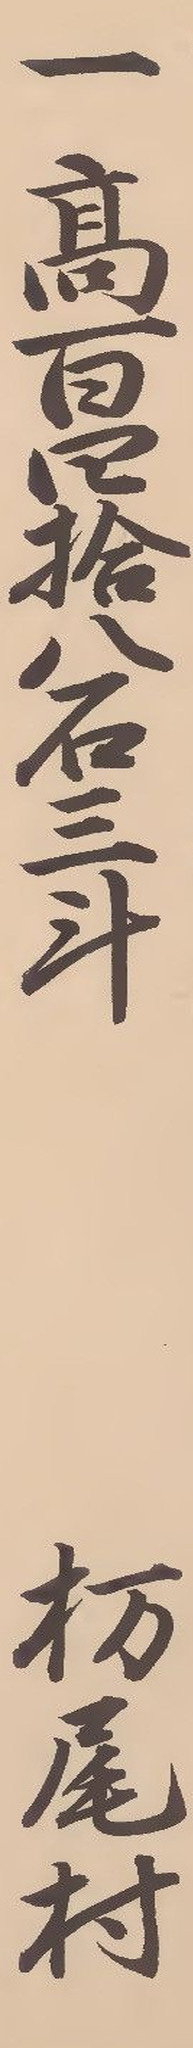一高百四拾八石三斗栃尾村
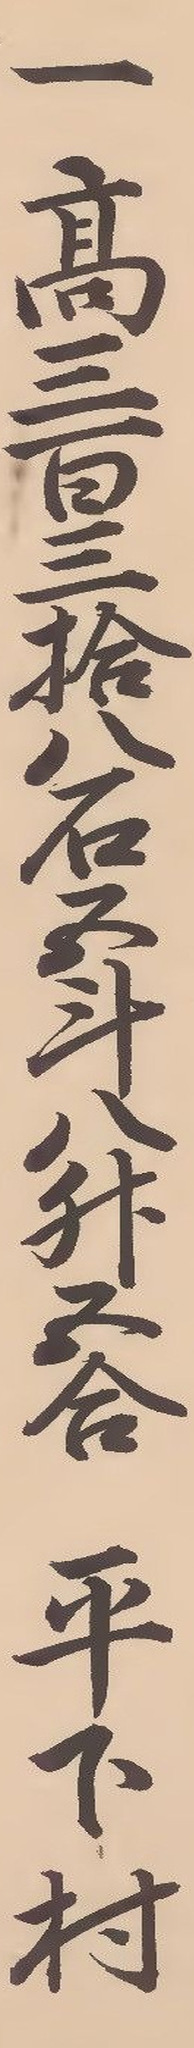一高三百三拾八石五斗八升五合平下村

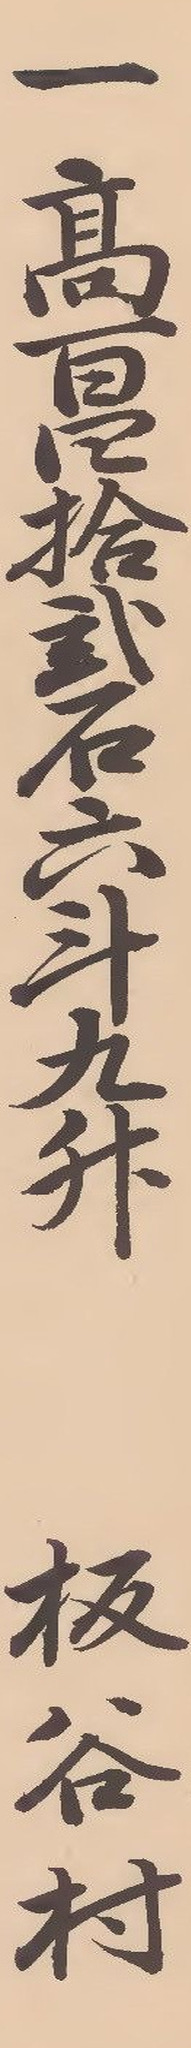一高百四拾弐石六斗九升板谷村
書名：加賀国郷帳
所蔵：国立公文書館 National Archives of Japan
